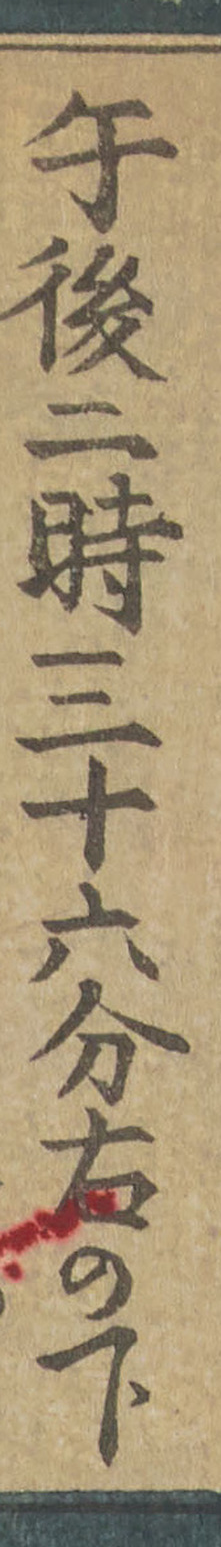午後二時三十六分右の下
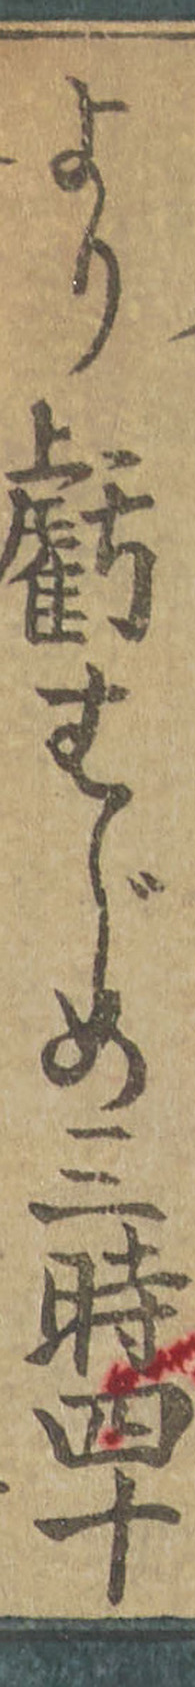より虧はじめ三時四十
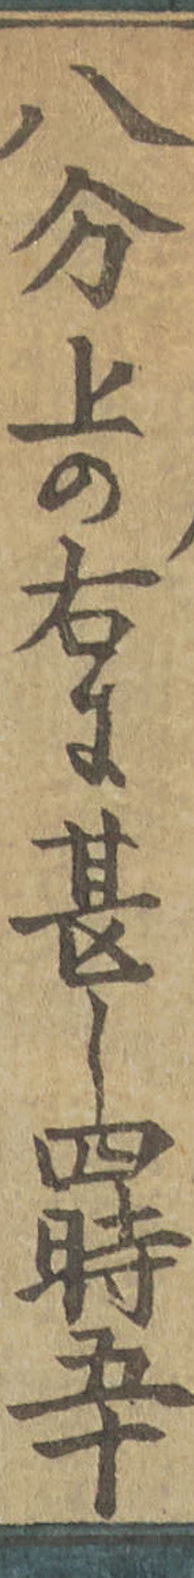八分上の右に甚し四時五十
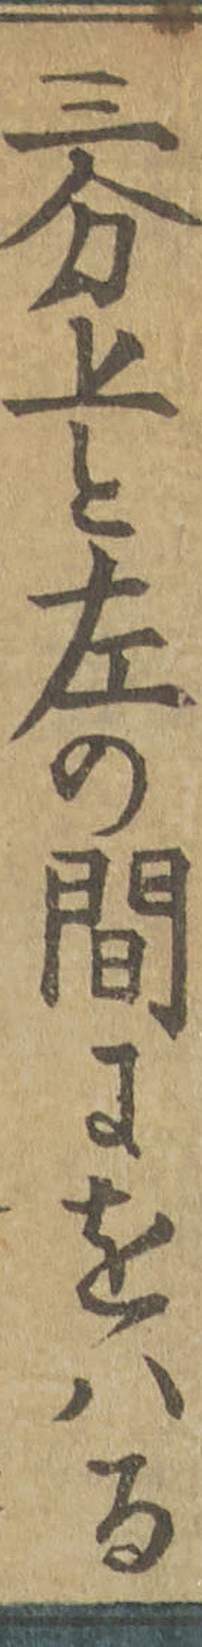三分上と左の間にをはる
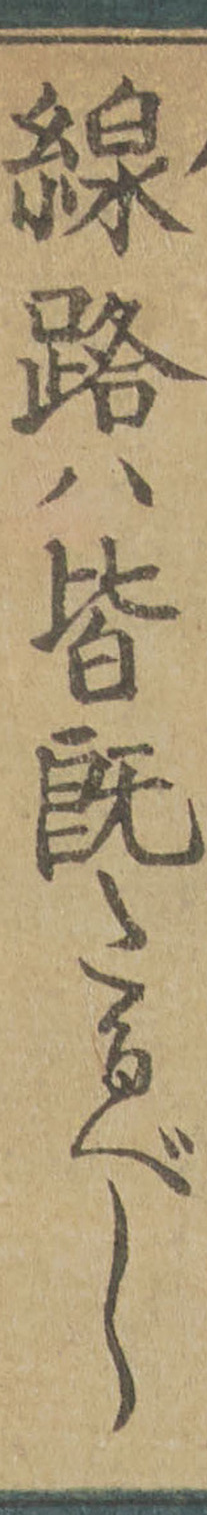線路は皆既たるべし
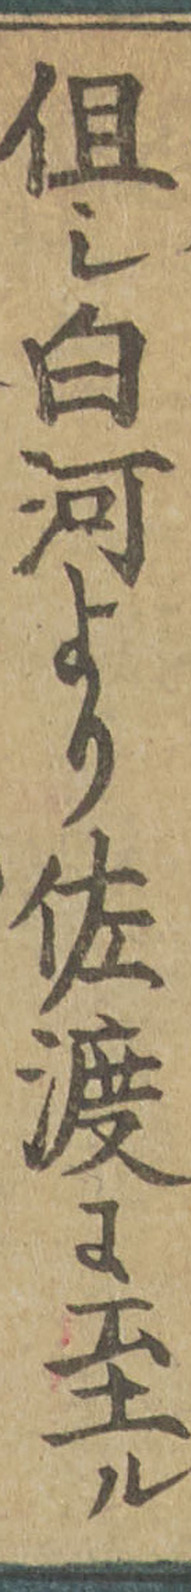伹し白河より佐渡に至る
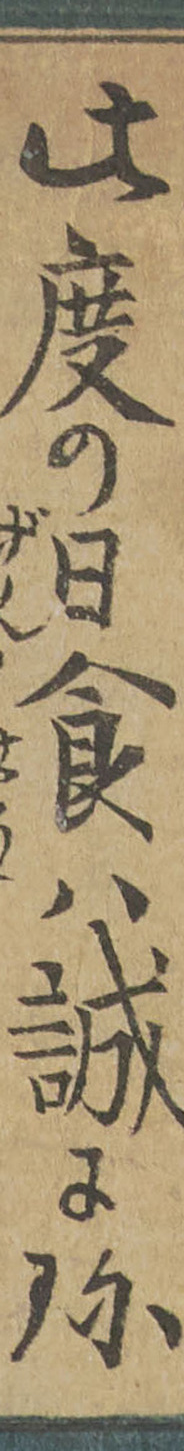此度の日食は誠に珎
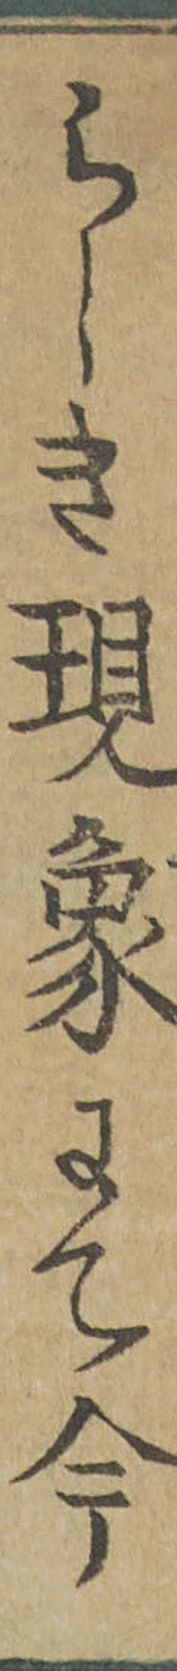らしき現象にて今
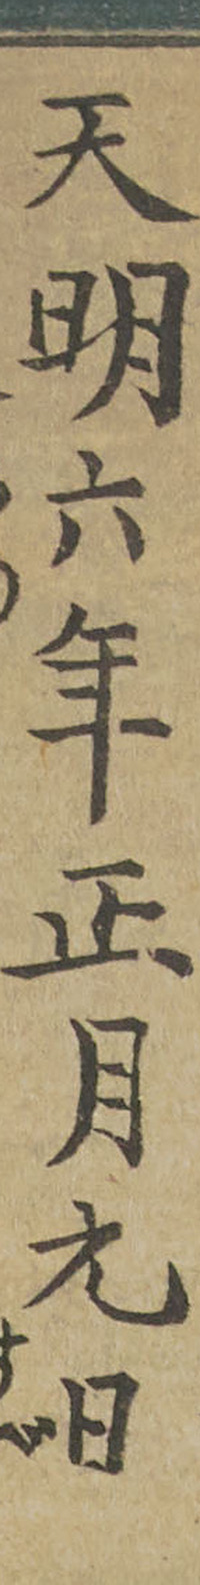天明六年正月元日
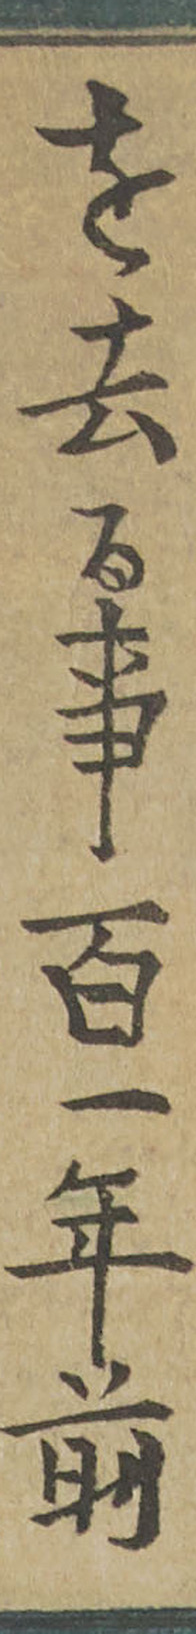を去る事百一年前
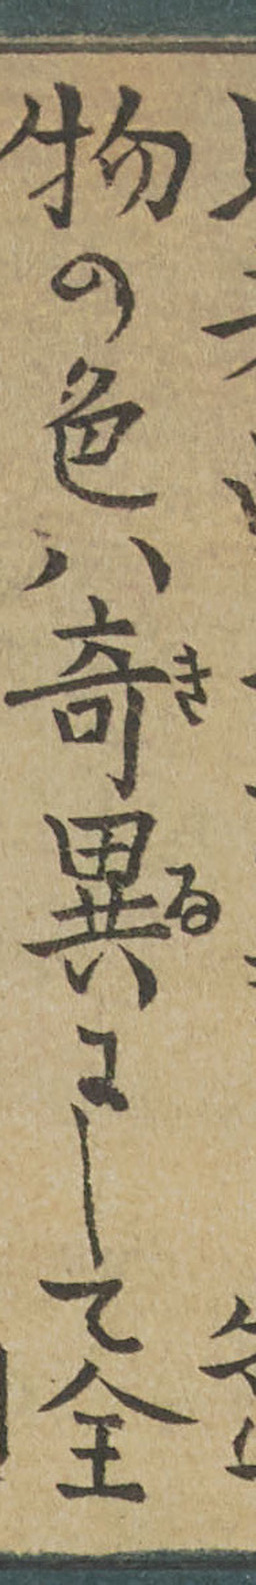物の色は奇異にして全
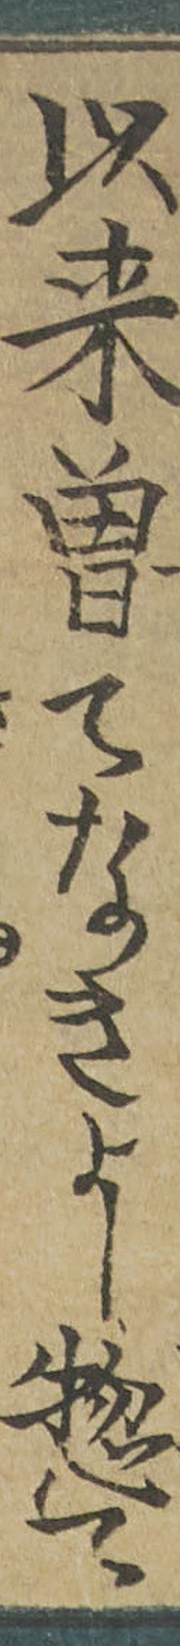以来曽てなきよし惣て
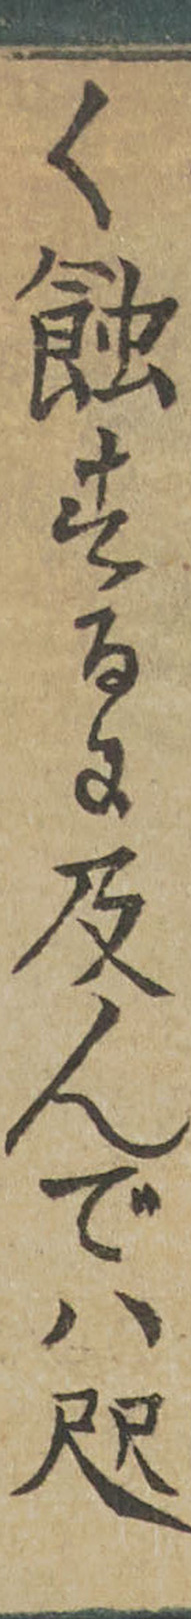く蝕するに及んでは咫
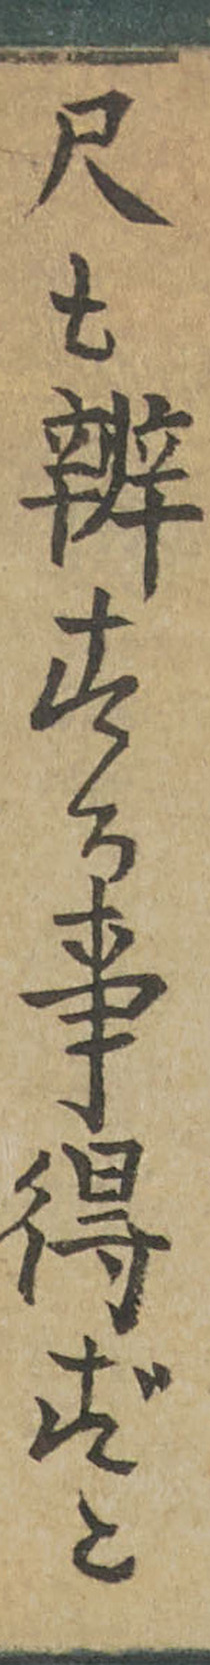尺も辨する事得ずと
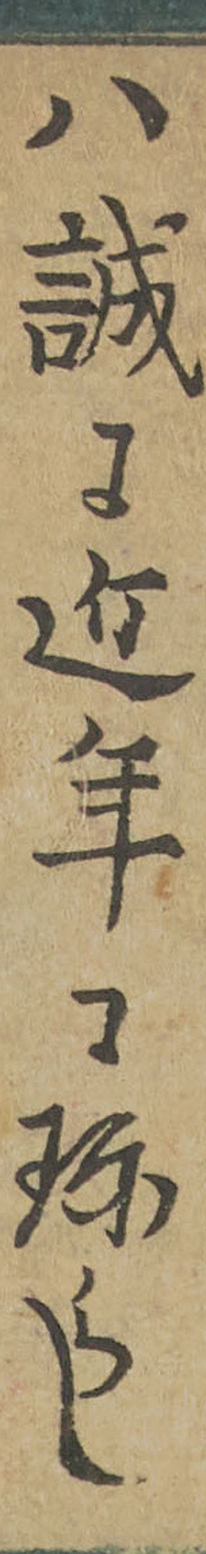は誠に近年に珎らし
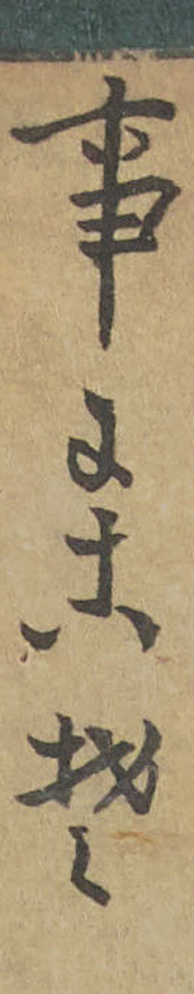事にこそ
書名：明治二十歳八月十九日日食九分九厘余
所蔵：東京大学総合図書館 General Library in the University of Tokyo, JAPAN
